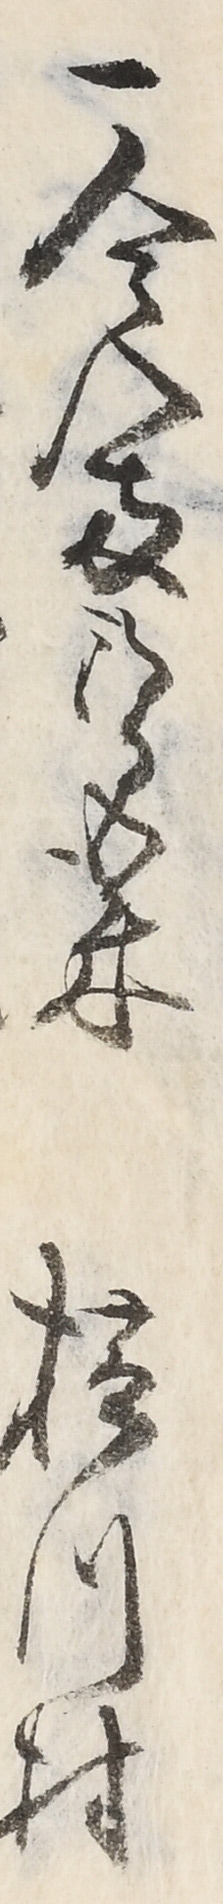一金八両弐分弐朱横川村
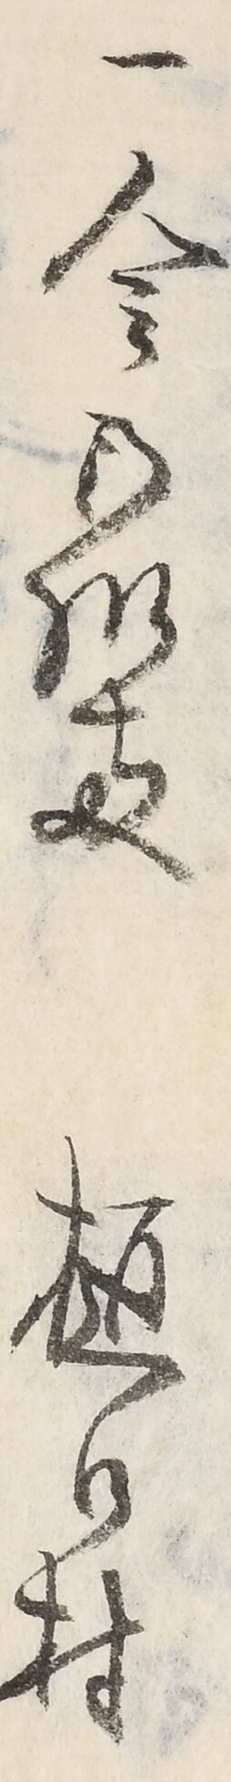一金弐拾両樋口村
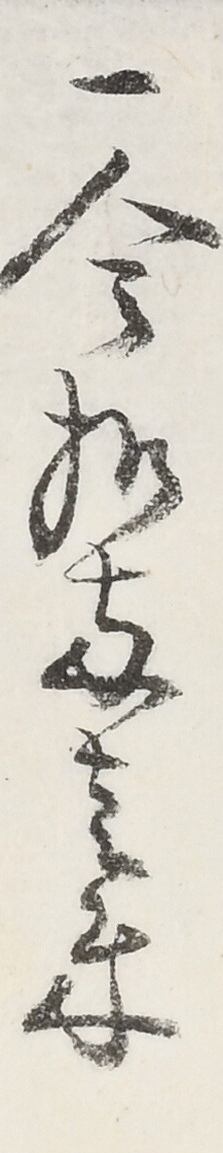一金拾両壱朱新町村
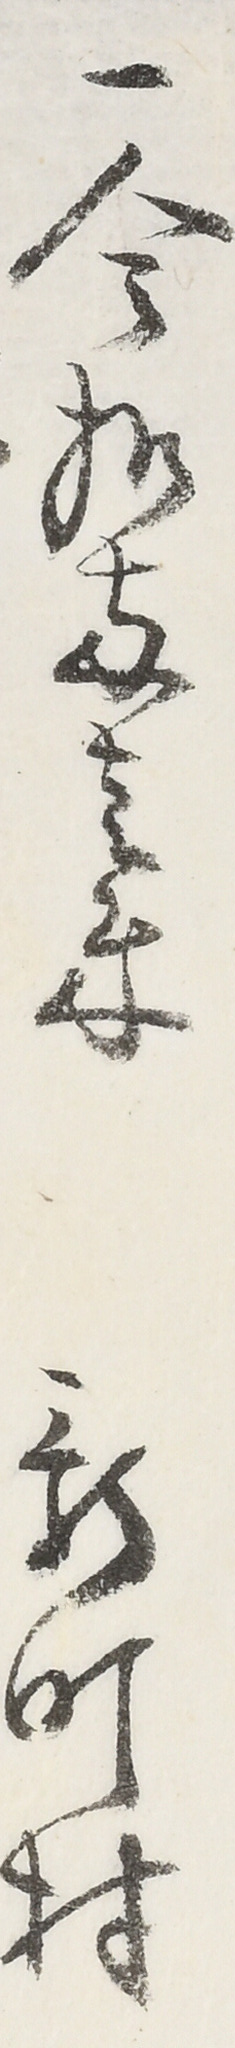一金拾両壱朱新町村
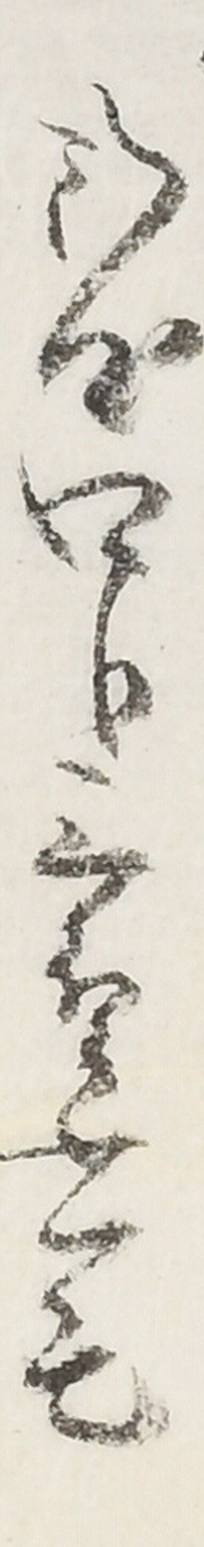弐匁四分三厘六毛
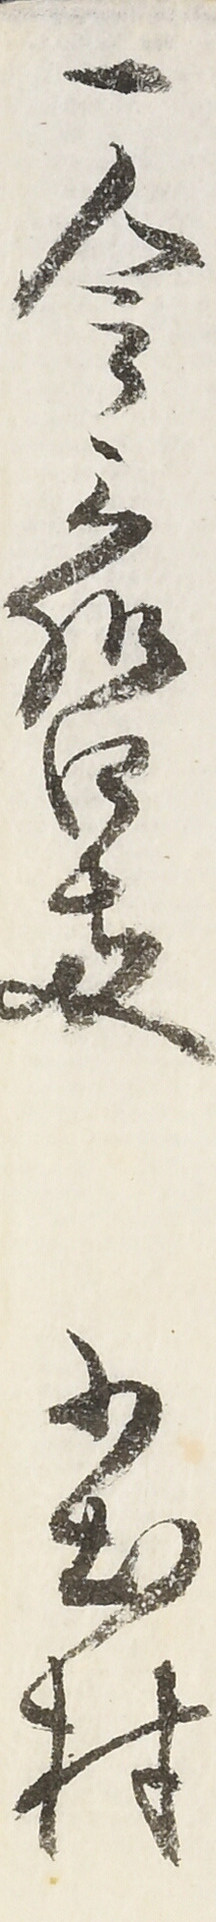一金三拾四両小出村
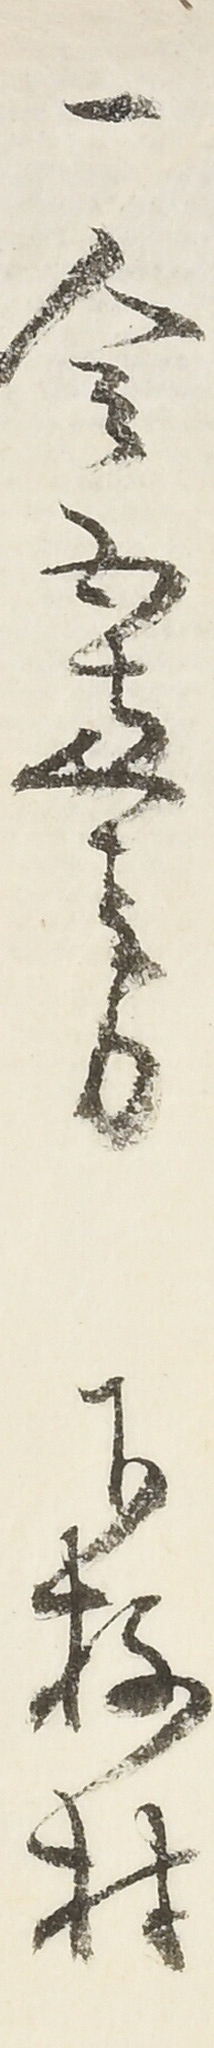一金五両壱分下牧村
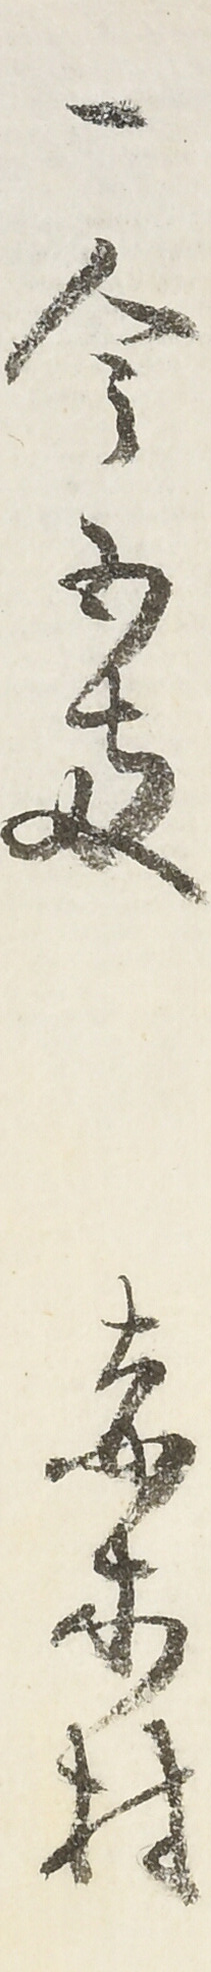一金五両赤木村
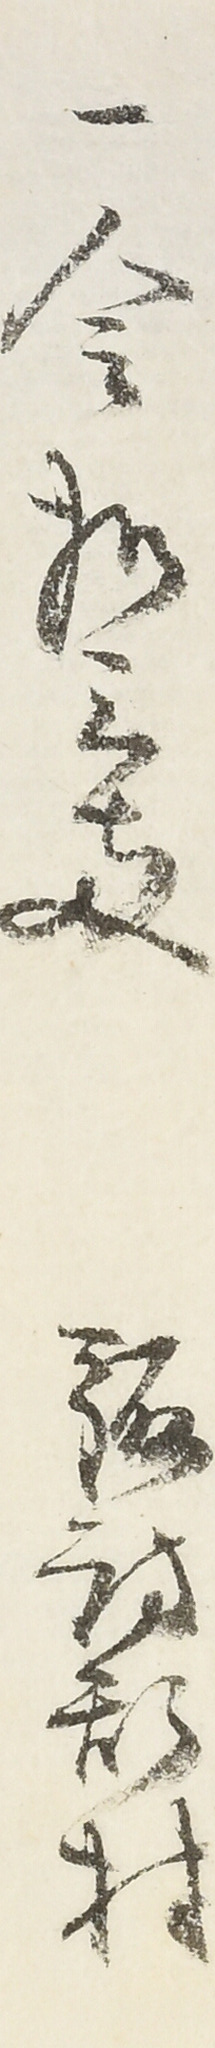一金拾三両諏訪形村
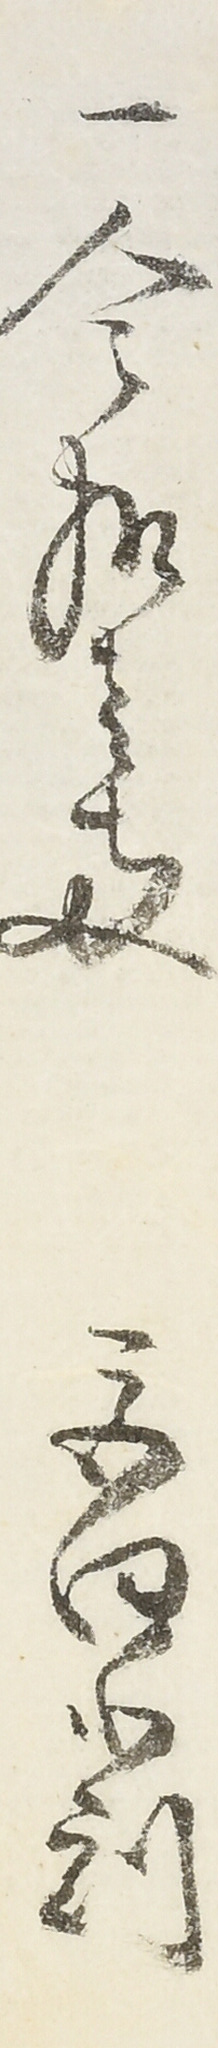一金拾壱両宮田北割
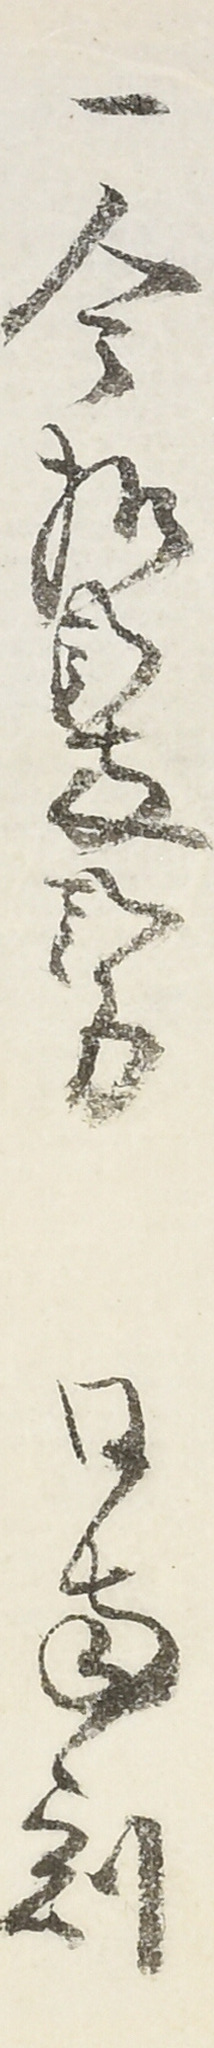一金拾弐両弐分同南割
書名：在町帯刀献金割帳
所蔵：伊那市立高遠町図書館・合同会社AMANE
